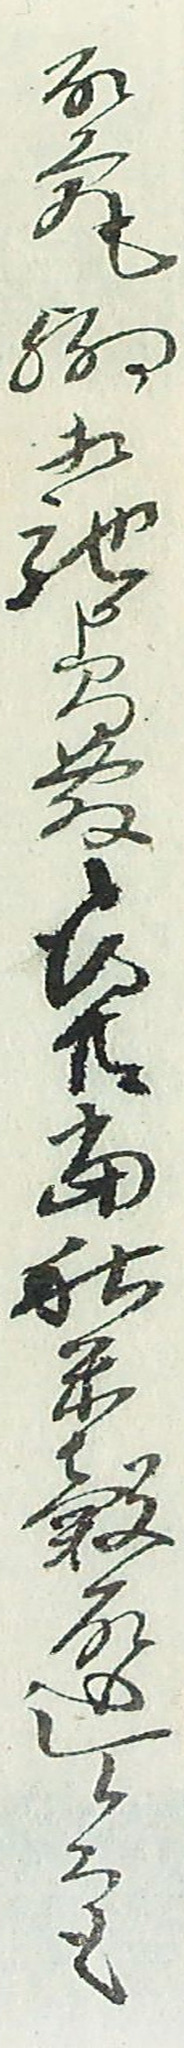取究聊相弛申間敷候得共當秋米穀取込候而も
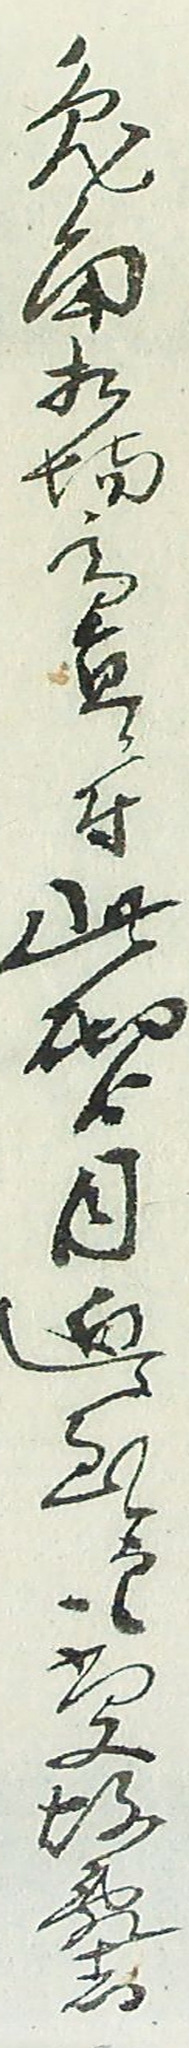兎角相場高直ニ付此砌ゟ月迫ニ至候而も尚亦胡乱者
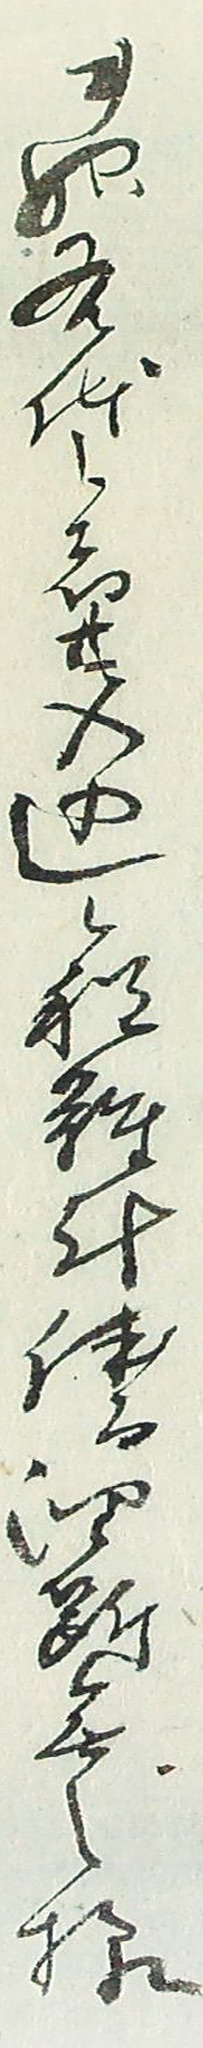ヲ始右体之者共入込候程難計依而油断無之様
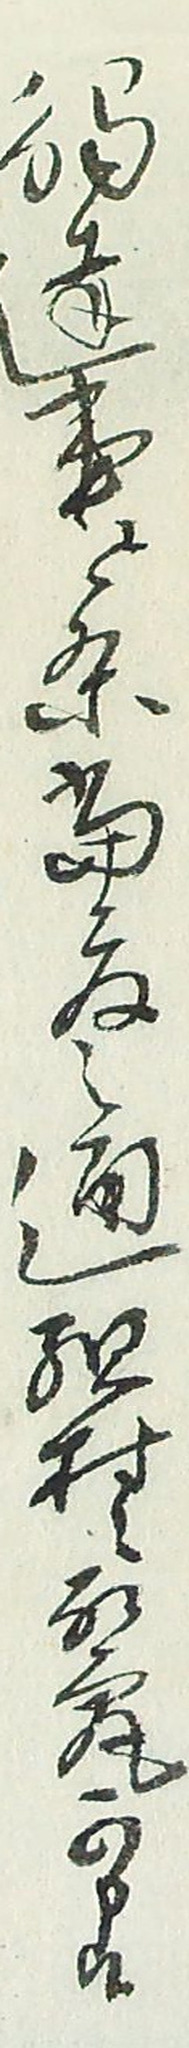觸達事ニ候条當夏之通組村々取究可申候
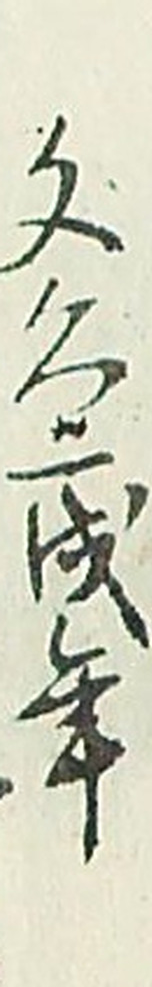文久二戌年
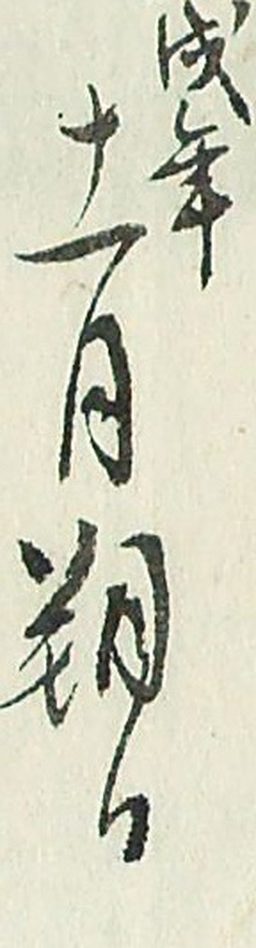十一月朔日
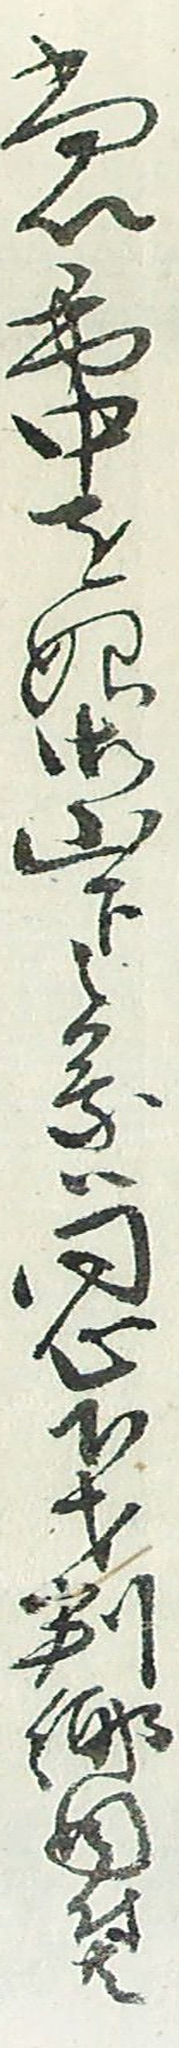尚以市中を始御山下之義ハ同心下才判郷目付共
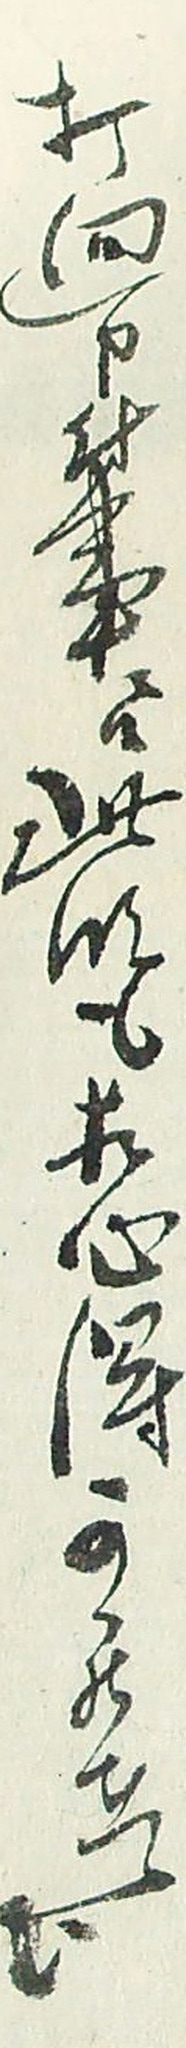打廻申付事ニ候此段も相心得可罷在候以上
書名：諸御趣意書并御下知向之写
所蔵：鳴門教育大学 Naruto University of Education
